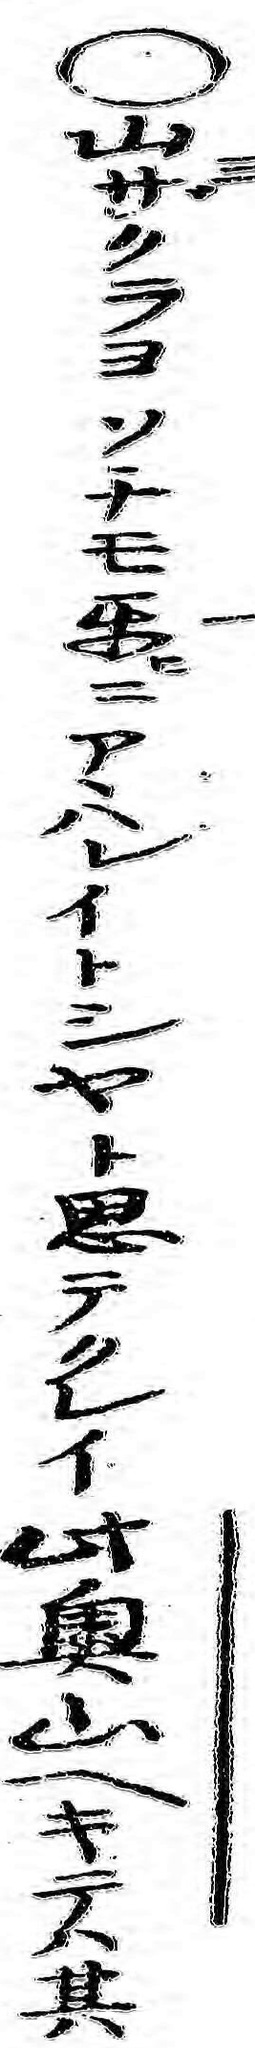○山ザクラヨソチモ互ニアヽハレイトシヤト思テクレイ此奥山ヘキテハ其
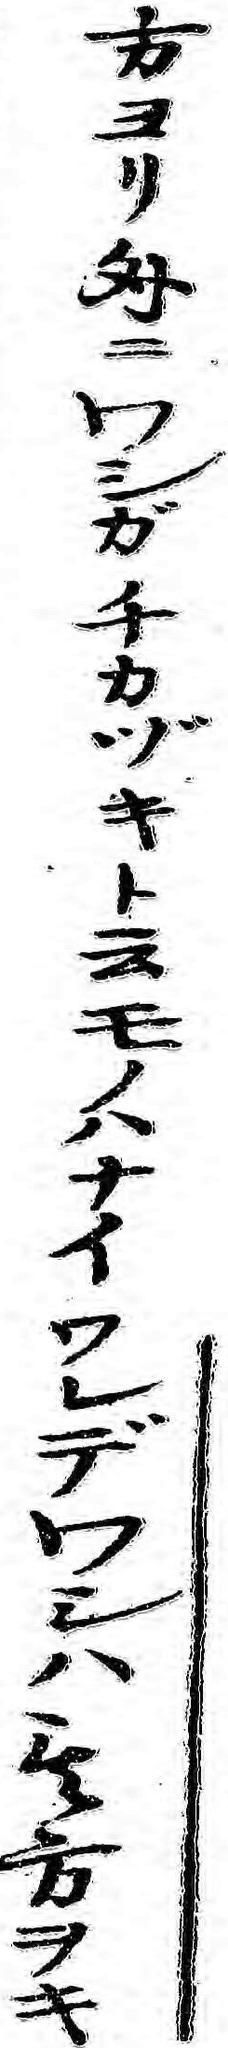方ヨリ外ニワシガチカヅキト云モノハナイワレデワシハ其方ヲキ
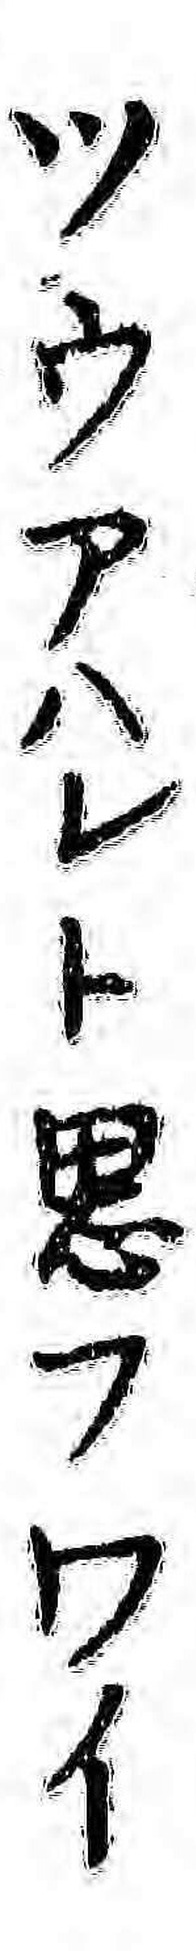ツウアハレト思フワイ
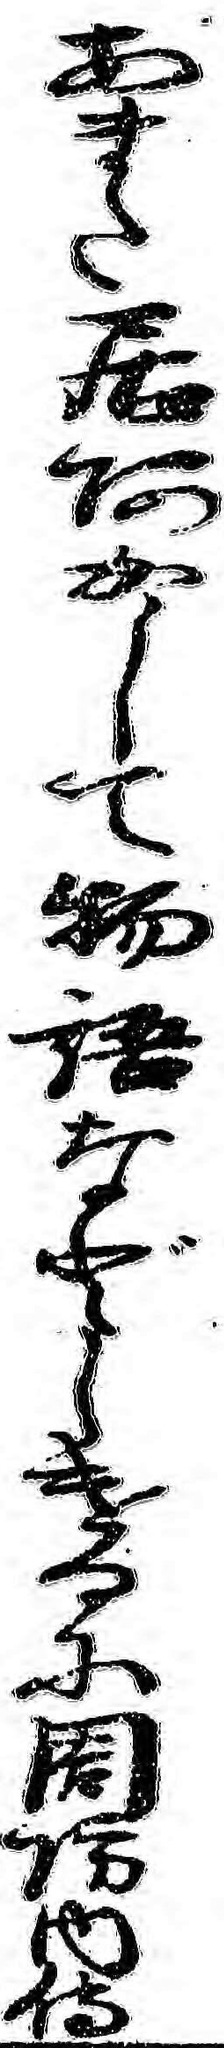あまた居あかして物語などしけるに周防内侍
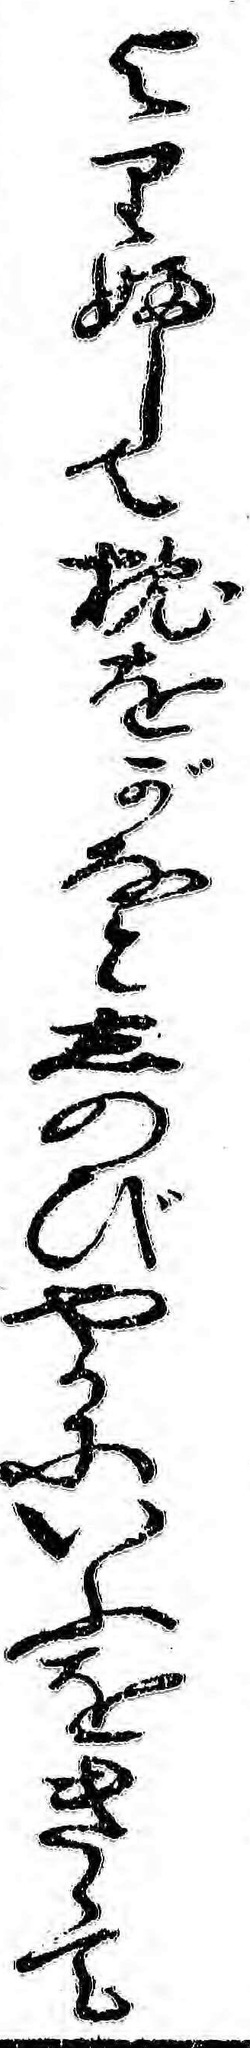よりふして枕をがなとしのびやかにいふをきゝて
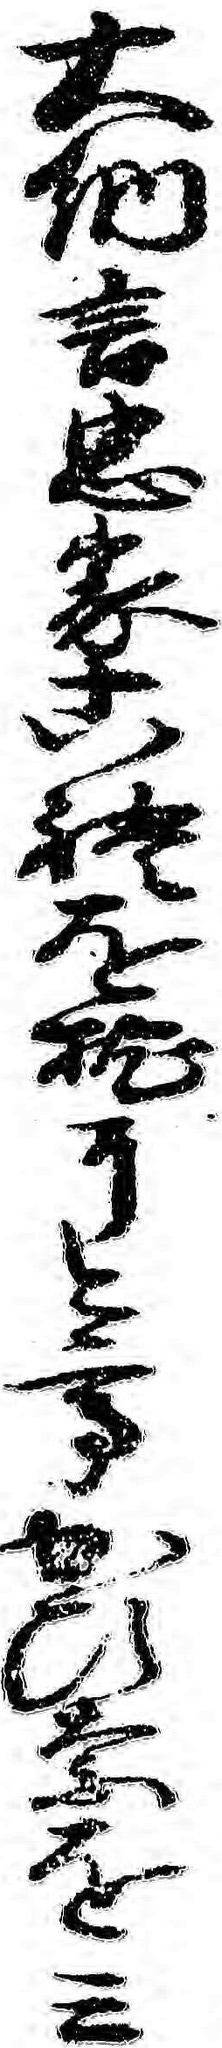大納言忠家これを枕にとてかひなをみ
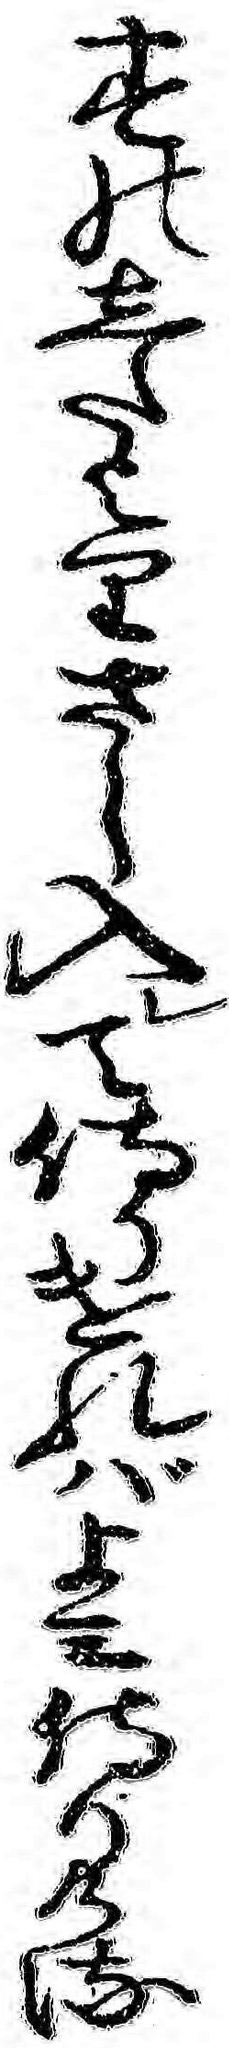すのしたよりさし入て侍りければよみ侍りける
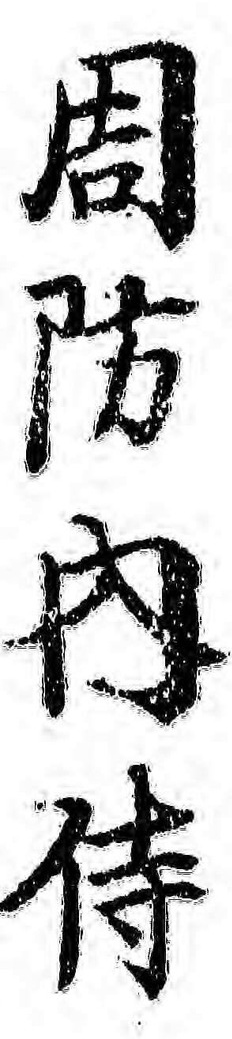周防内侍
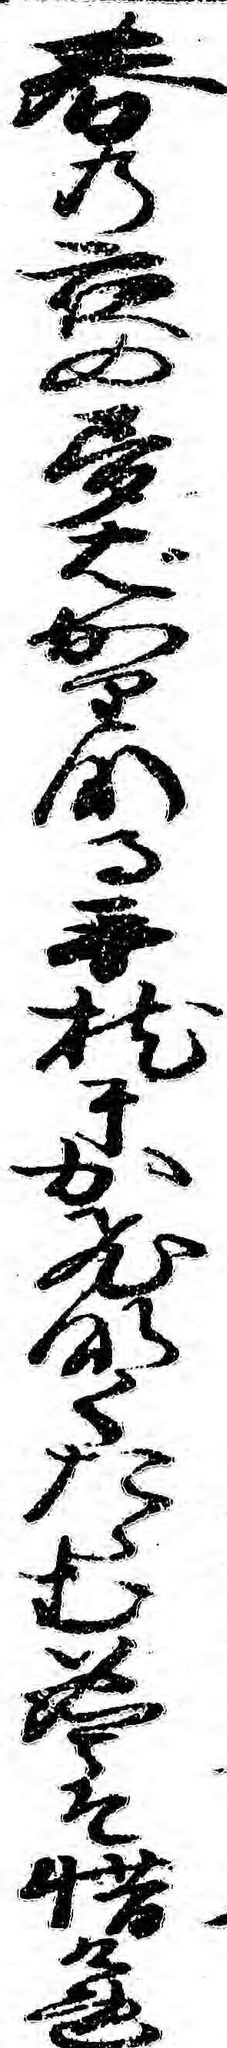春の夜の夢ばかりなる手枕にかひなくたゝむ名こそ惜けれ
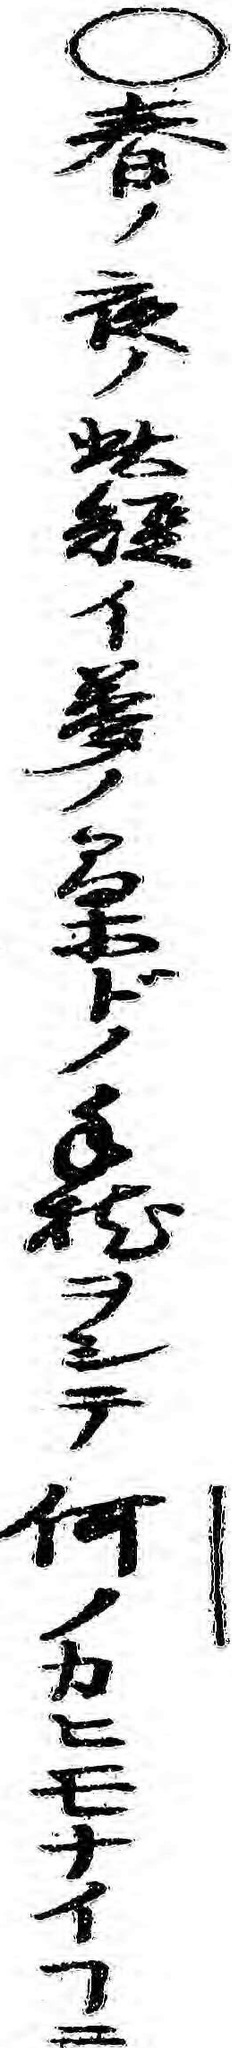○春ノ夜ノ此短イ夢ノ間ホドノ手枕ヲシテ何ノカヒモナイコトニ
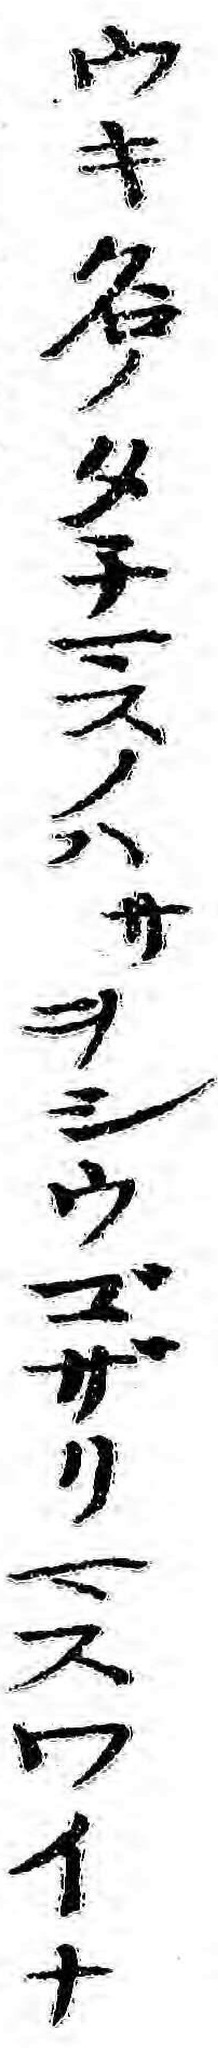ウキ名ノタネマスノハヲシウゴザリマスワイナ
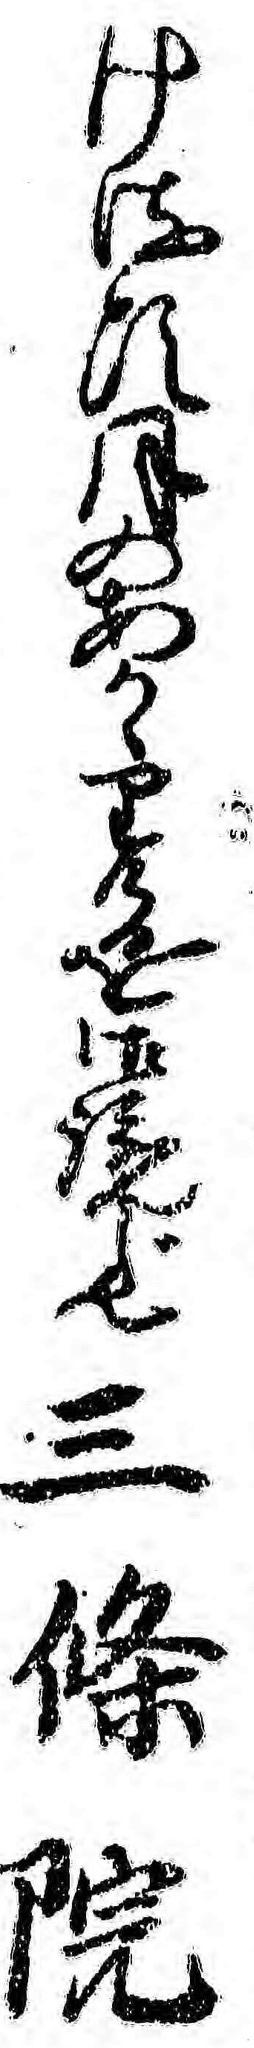ける頃月のあかゝりけるを御覧じて三条院
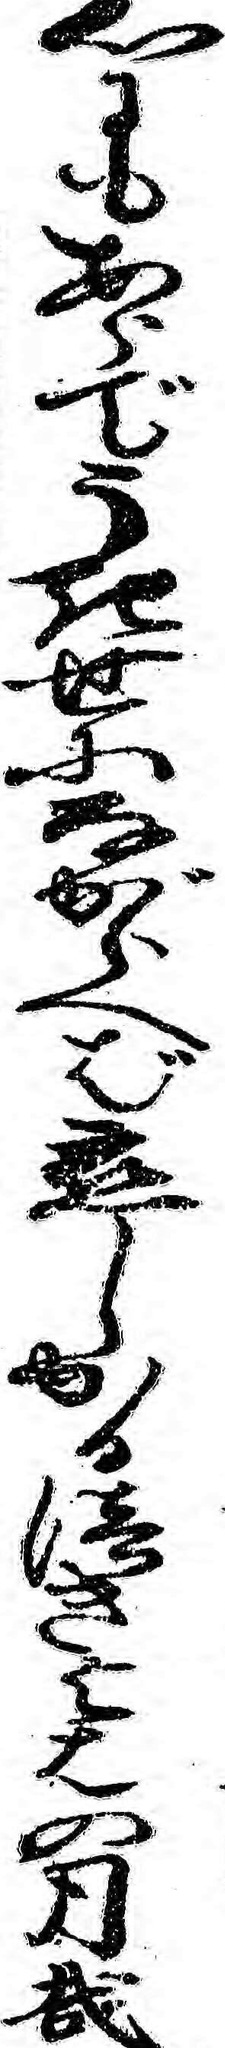心にもあらでうき世にながらへば恋しかるべきよはの月哉
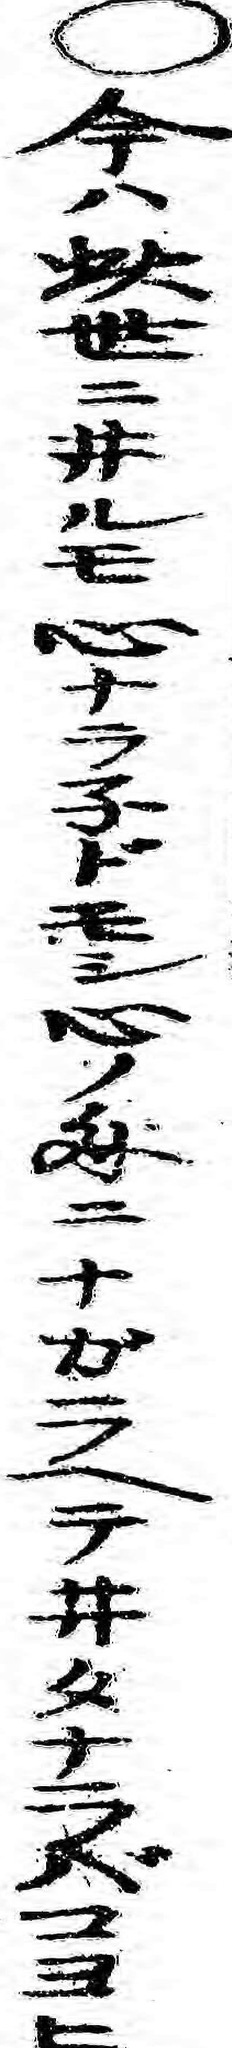○今ハ此世ニヰルモ心ナラネドモシ心ノ外ニナガラヘテヰタナラバコヨヒ

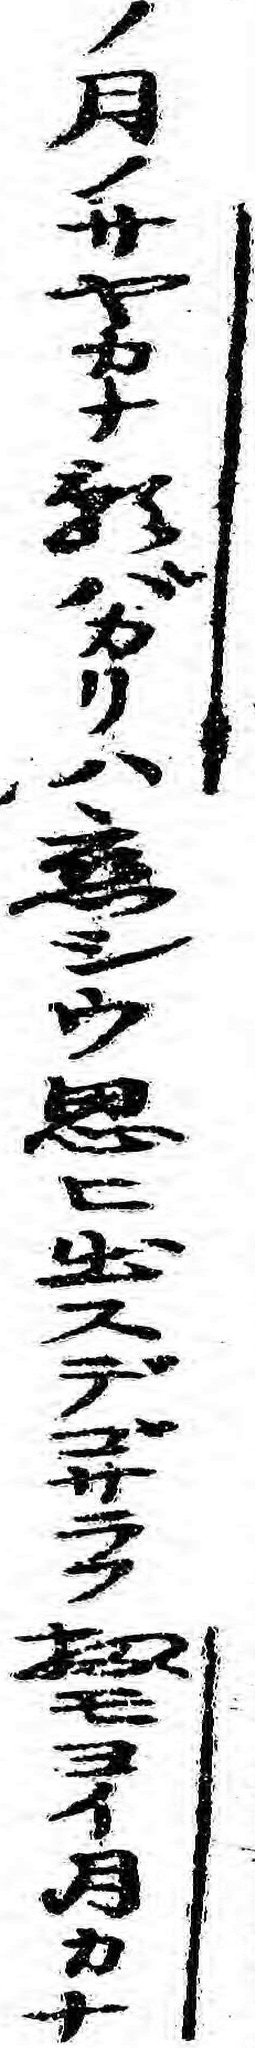ノ月ノサヤカナ願バカリハ恋シウ思ヒ出スデゴザラフ扨モヨイ月カナ
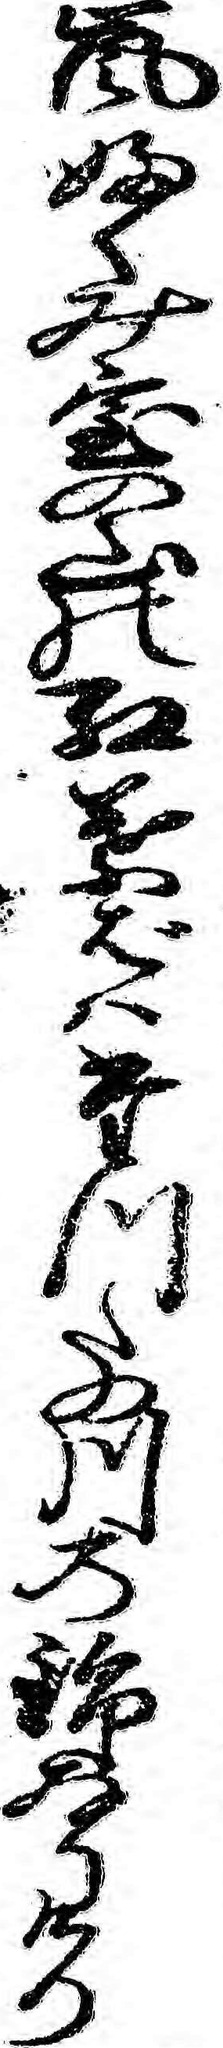嵐ふくみ室の山の紅葉ばはたつたの川の錦なりけり
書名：百人一首／小倉の山ふみ
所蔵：国文学研究資料館
